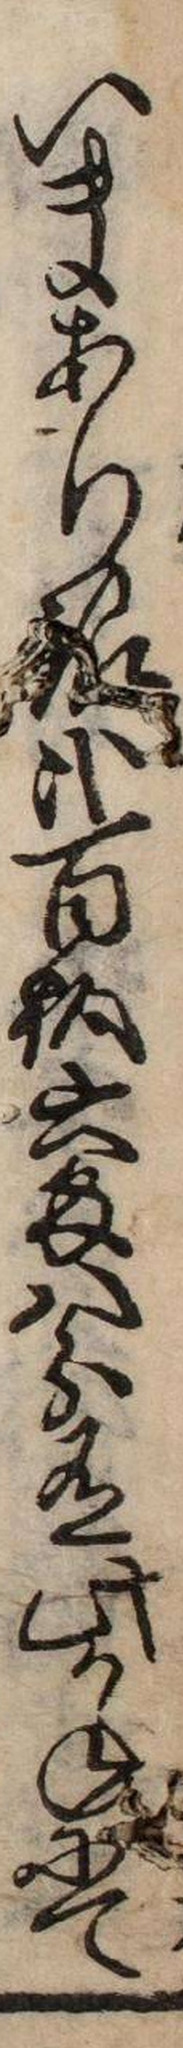いまあり銀弐百拾六匁八分有此かねにて
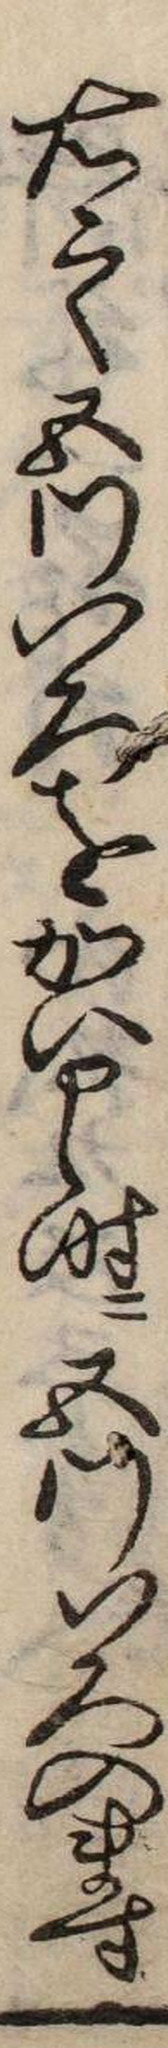右の五ついろをかい申時に五ついろのます
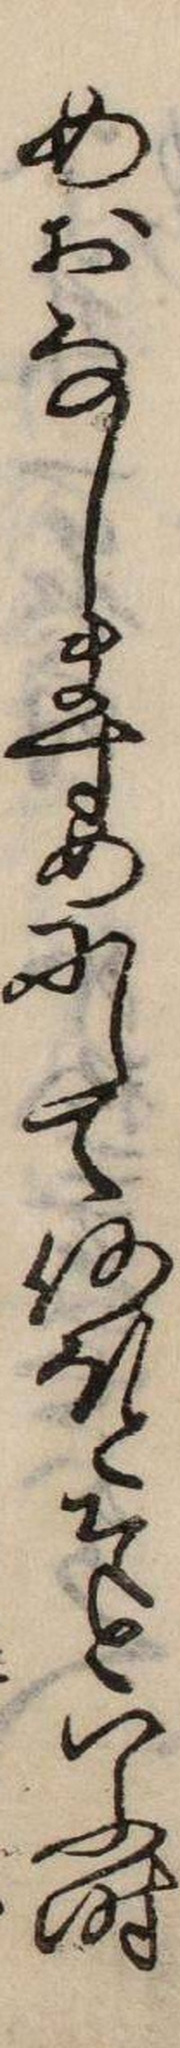めおなしますめにして何ほとそといふ時
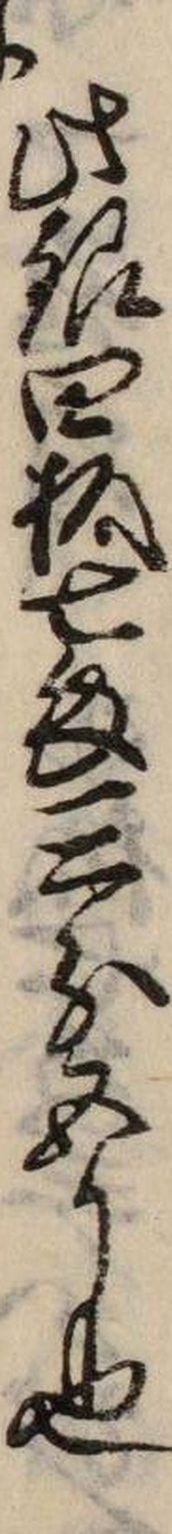此銀四拾七匁三分五厘也
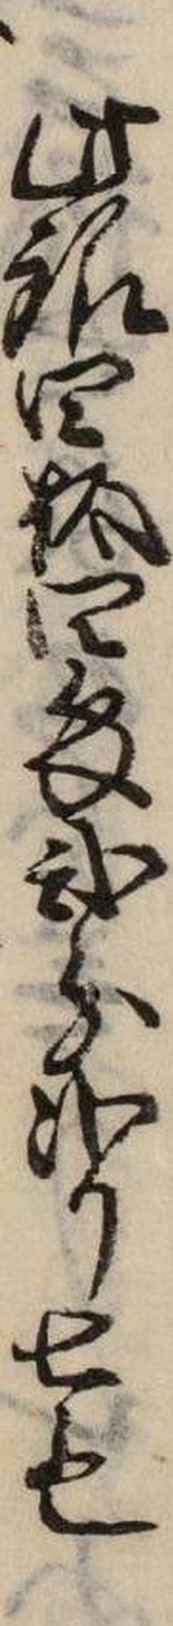此銀四拾四匁弐分弐厘七毛
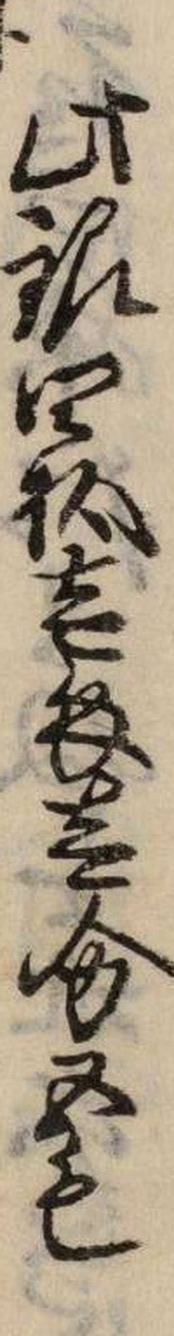此銀四拾壱匁壱分五毛
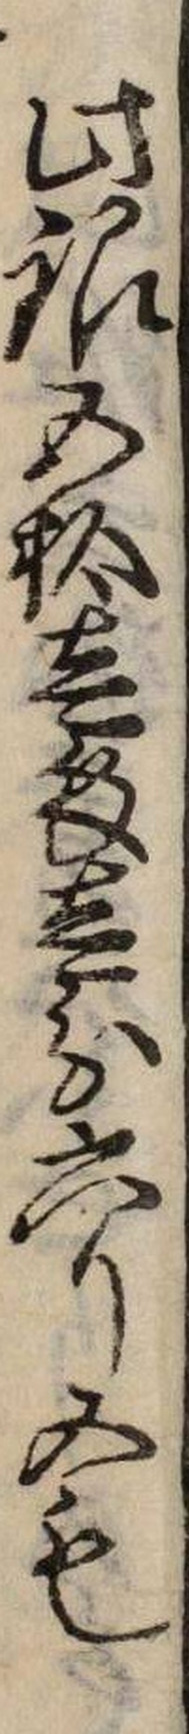此銀五拾壱匁壱分六厘五毛
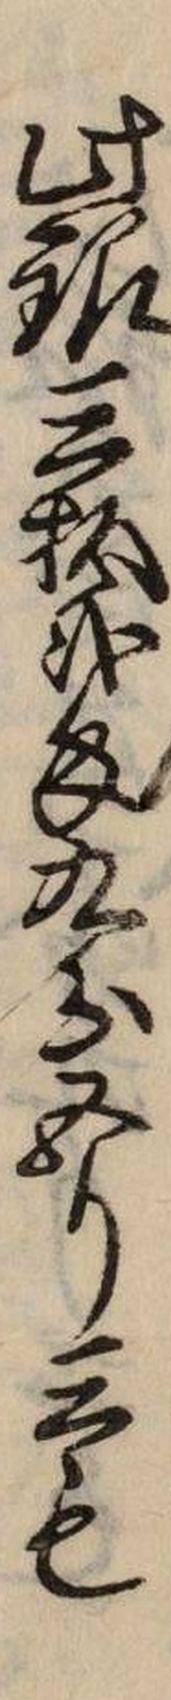此銀三拾弐匁九分五厘三毛
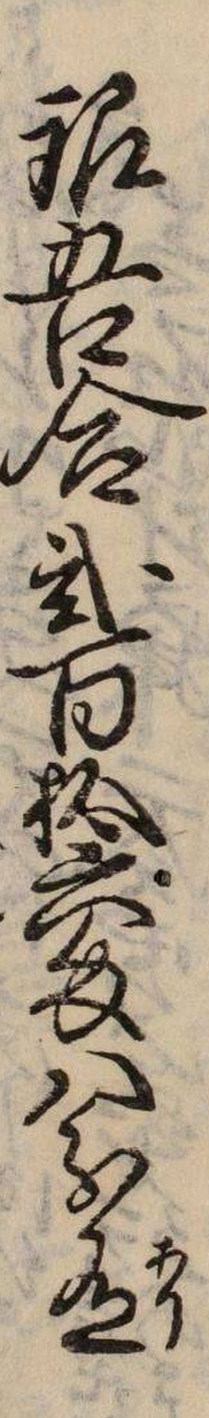銀五口合弐百拾六匁八分有
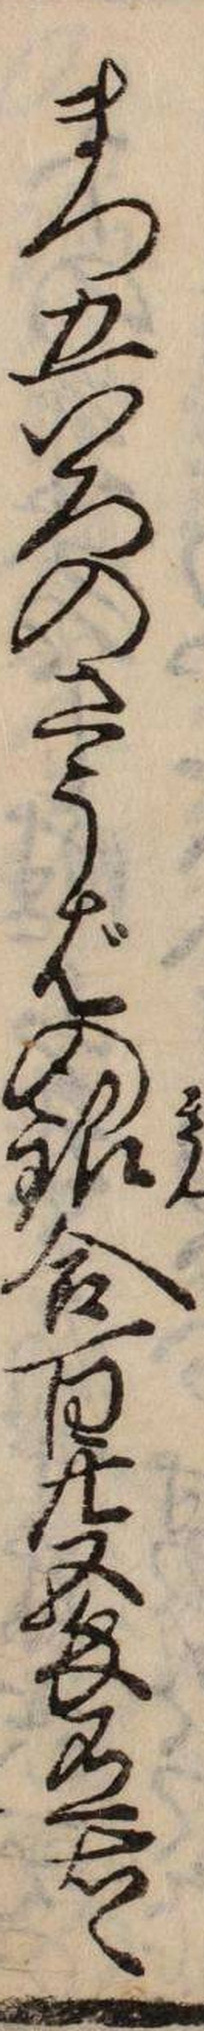まつ五いろのさうぱの銀合百廿五匁有右の
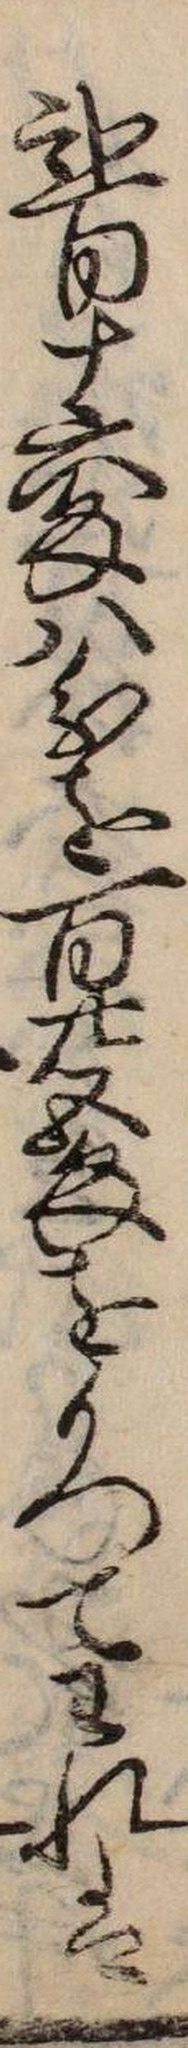弐百十六匁八分を百廿五匁をもつてわれは
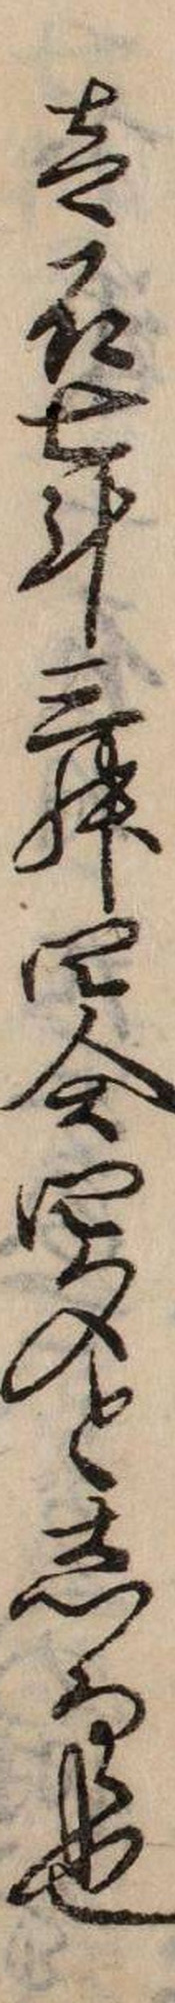壱石七斗三舛四合四勺としるゝ也
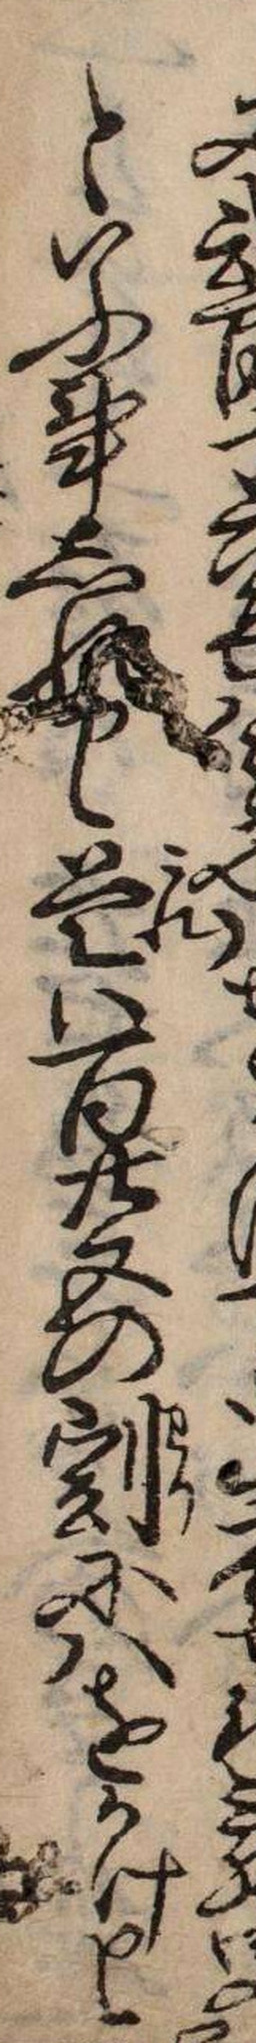といふ事しれ申候是は百廿五の割に八をかけ申候

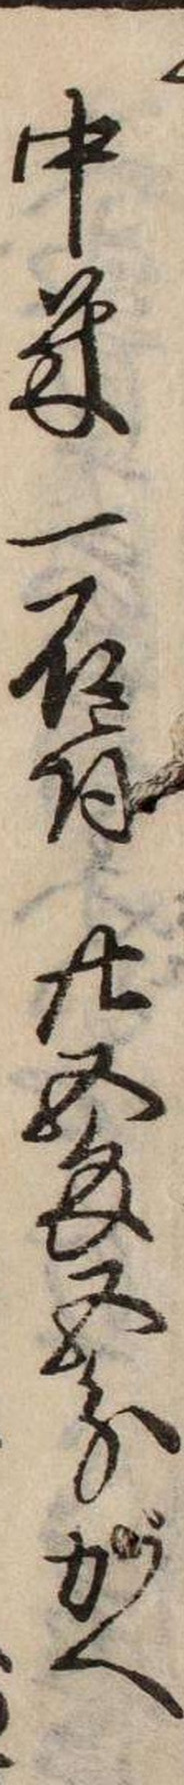中米一石に付廿五匁五分がへ
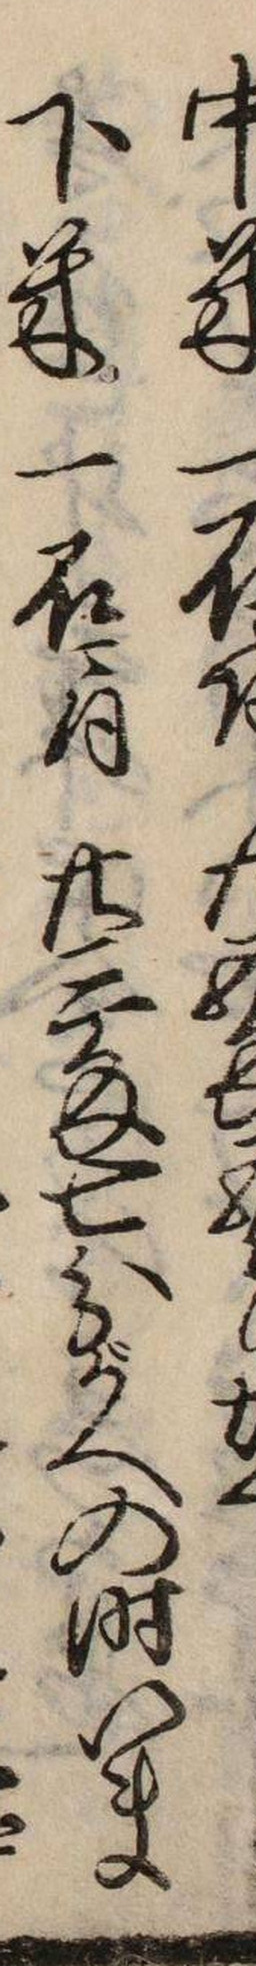下米一石に付廿三匁七分がへの時いま
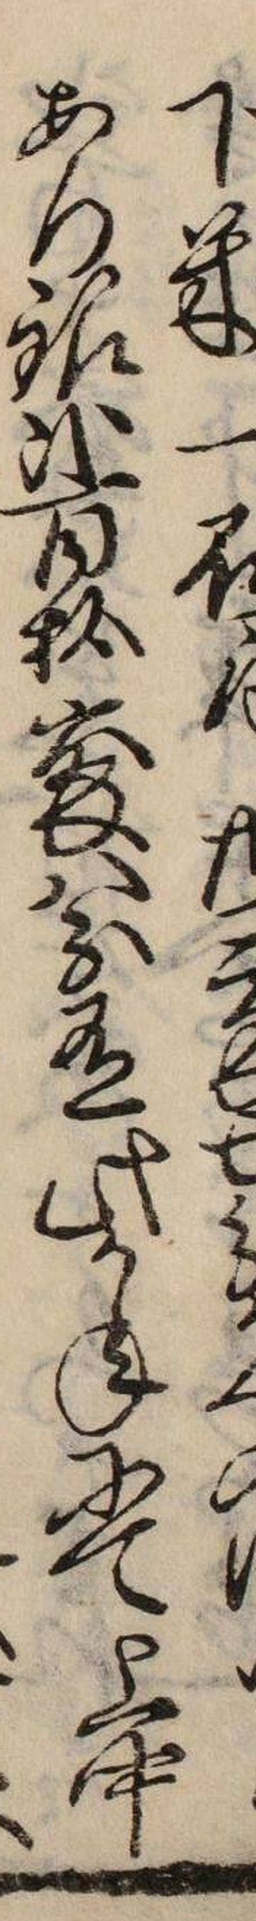あり銀弐百拾六匁八分有此かねにて上中
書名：塵劫記（寛永11年自跋、京都府立京都学・歴彩館追貴8）
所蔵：京都府立京都学・歴彩館 国文学研究資料館
